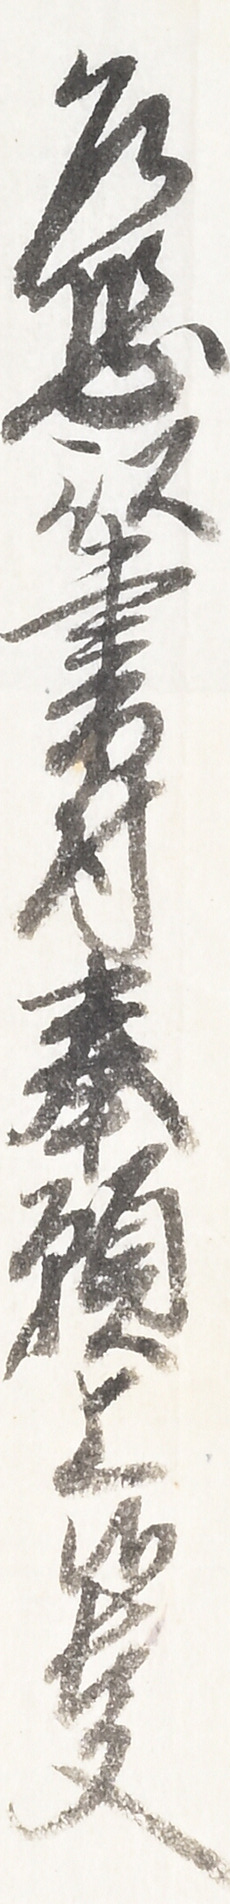乍恐以書付奉願上候事
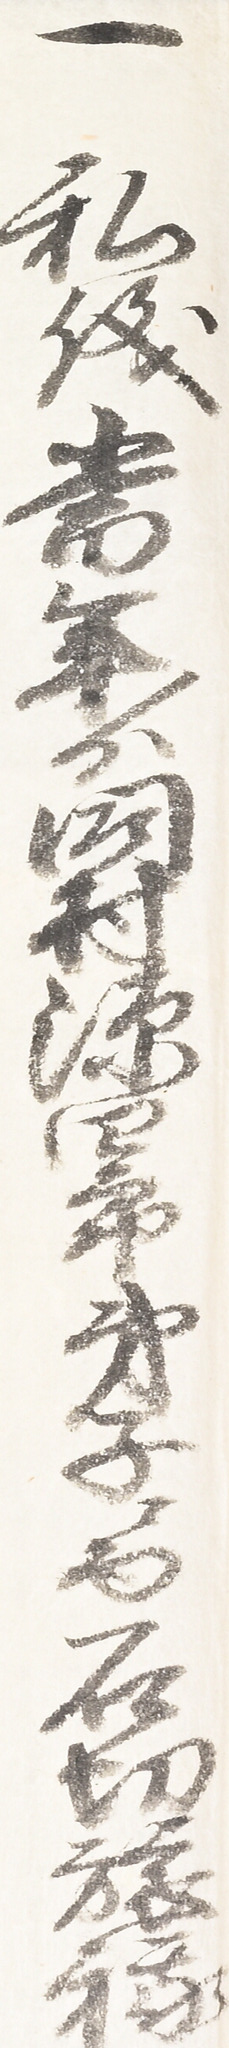一私儀当年ゟ同村源四郎弟子ニ而石切旅稼
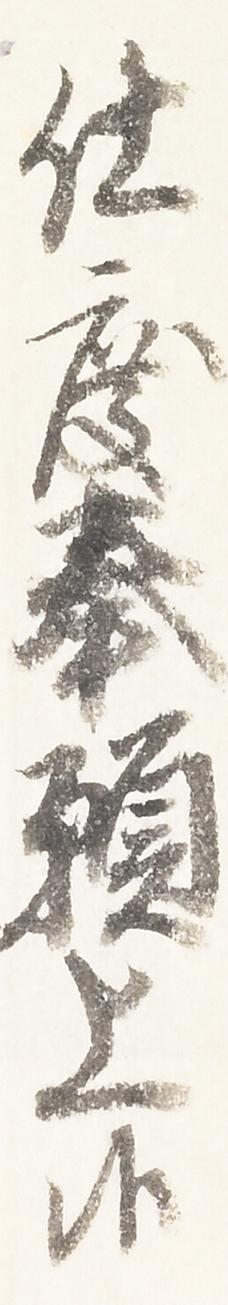仕度奉願上候
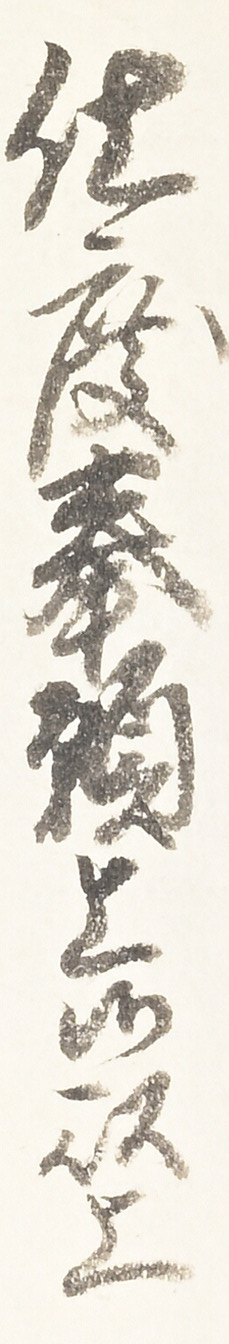仕度奉願上候以上
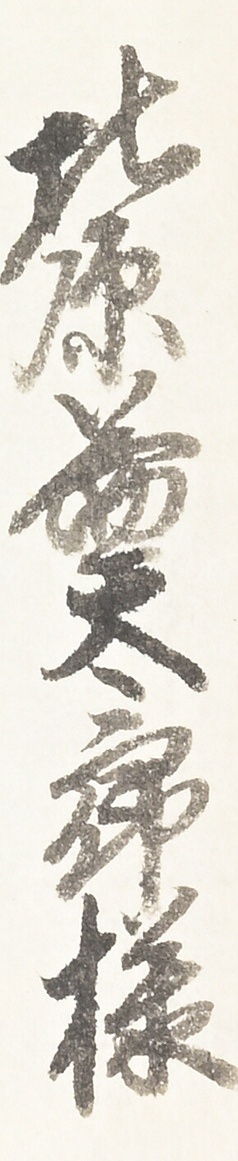北原益太郎様
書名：乍恐以書付奉願上候叓
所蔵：伊那市立高遠町図書館・合同会社AMANE
